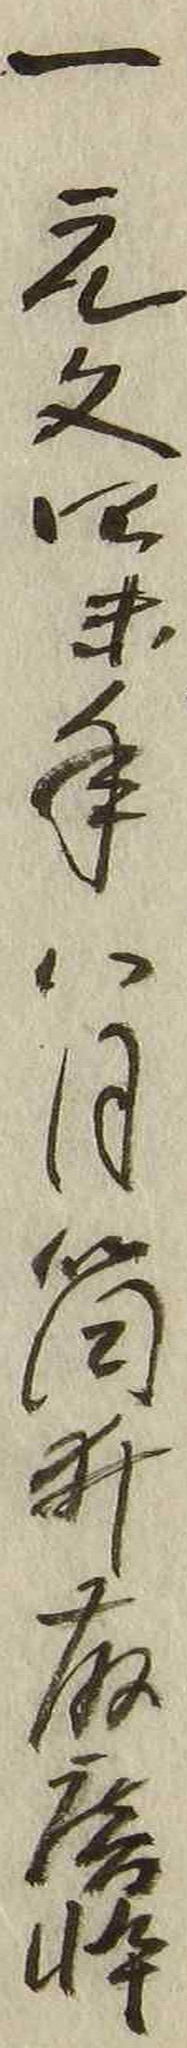一元文四未年八月筒井藤広忰
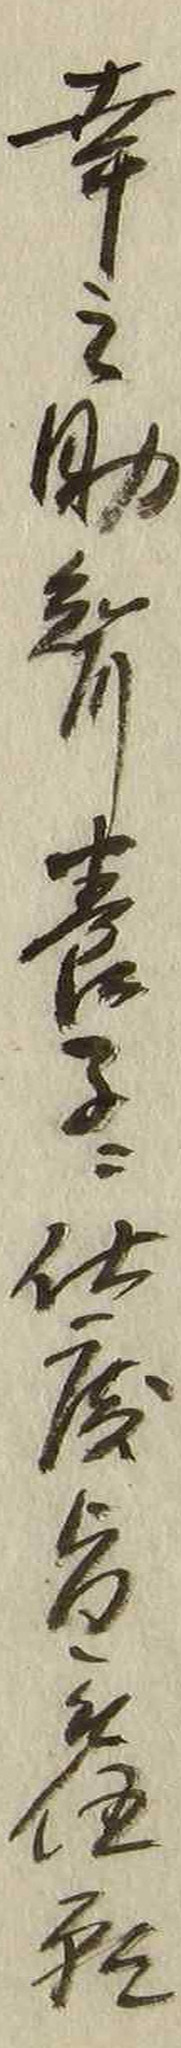幸之助婿養子ニ仕度旨被任願
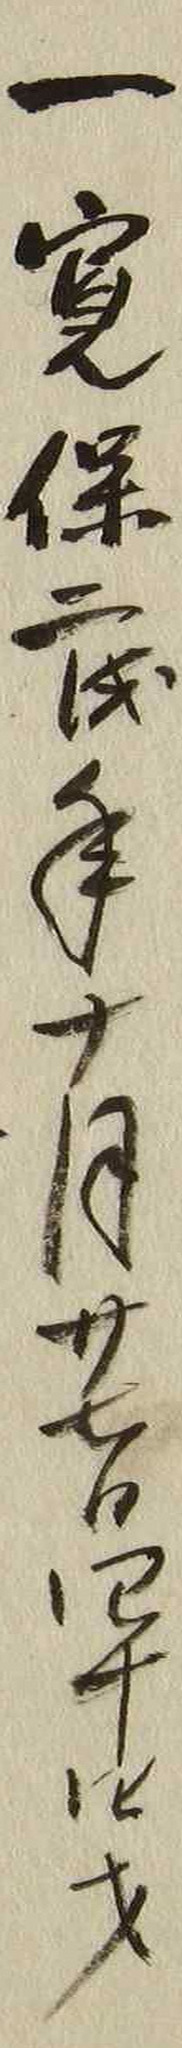一寛保二戌年十月廿七日四十四才
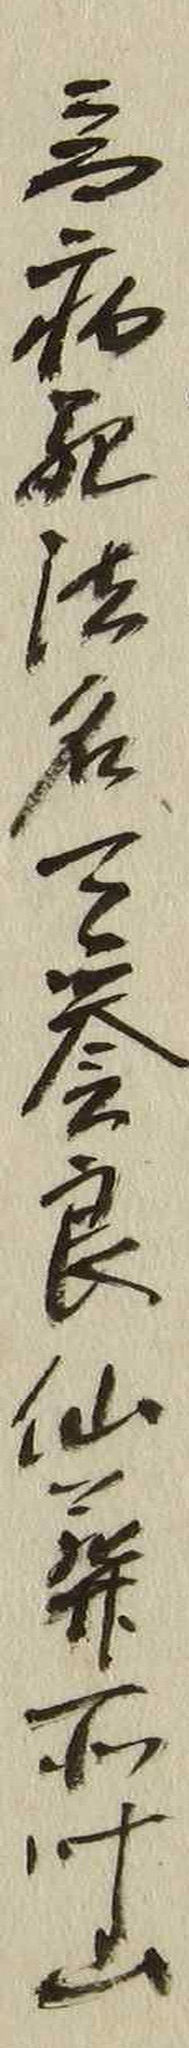ニ而病死法名天誉良仙葬所叶山
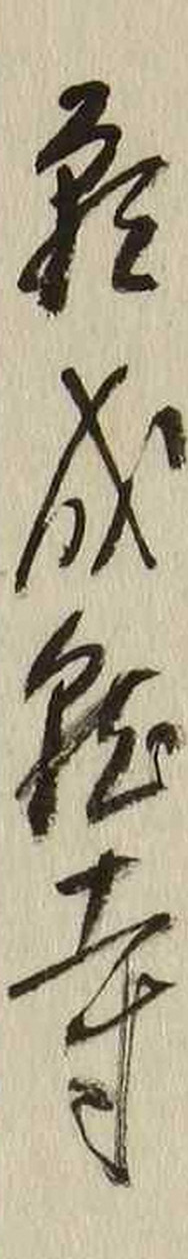願成就寺
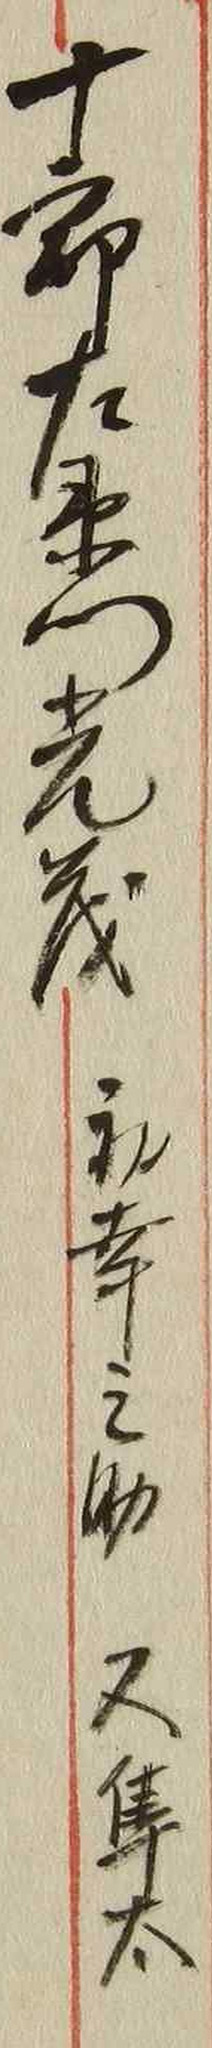十郎左衛門光茂初幸之助又隼太
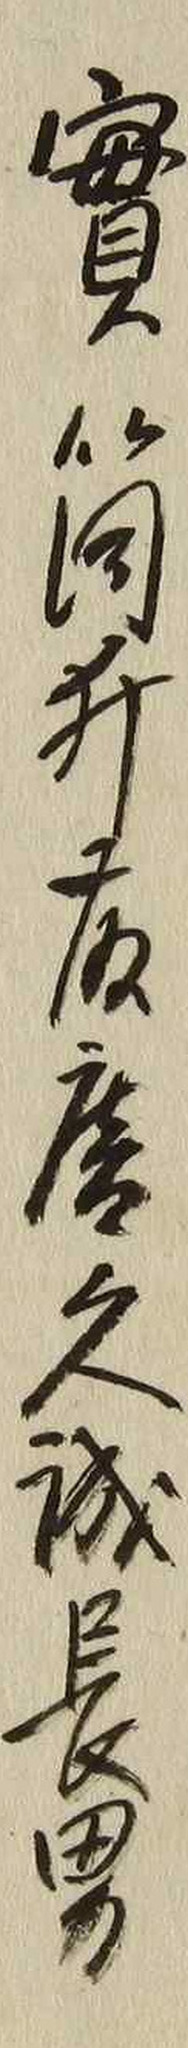実筒井藤広久誠長男
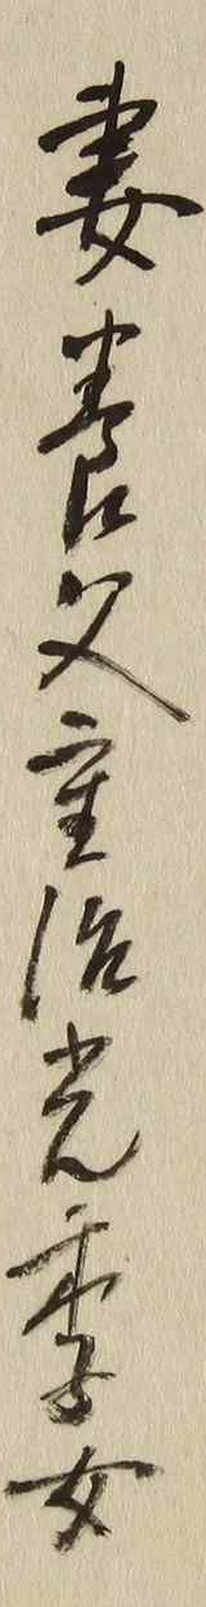妻養父重治光季女
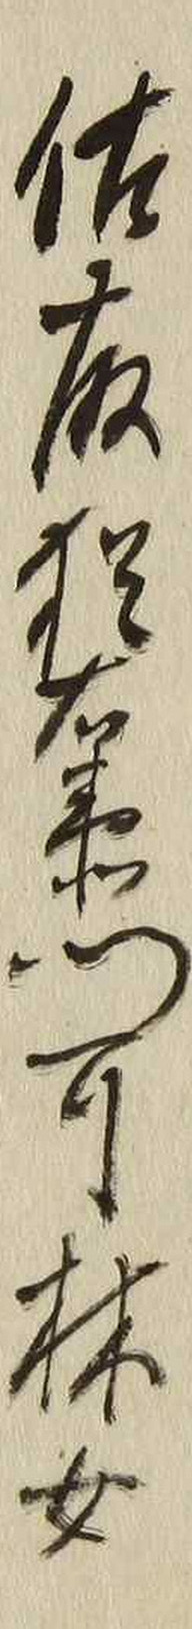佐藤猶右衛門可林女
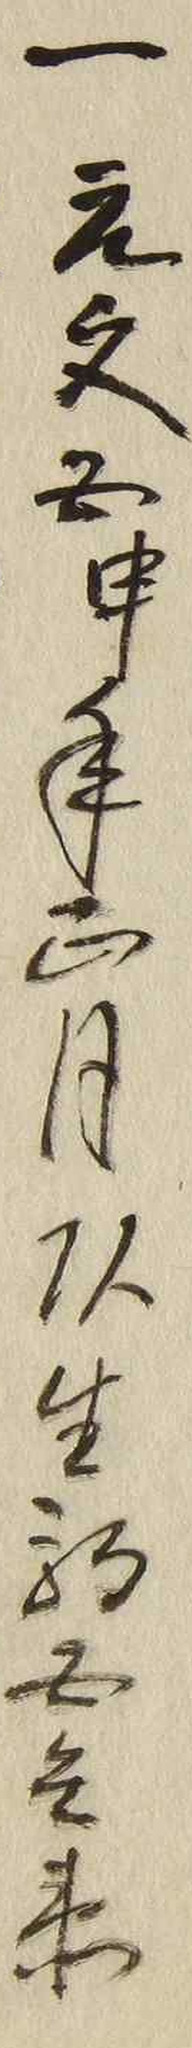一元文五申年正月頭生駒五兵衛
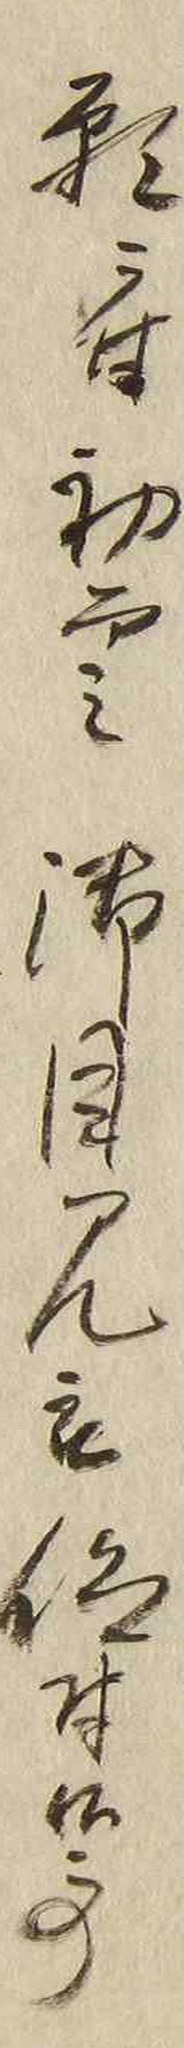願ニ付初而之御目見被仰付候事

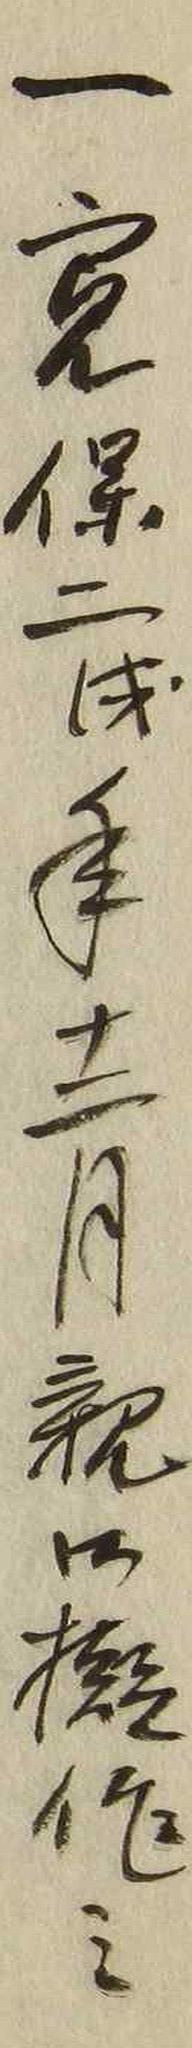一寛保二戌年十二月親御擬作之
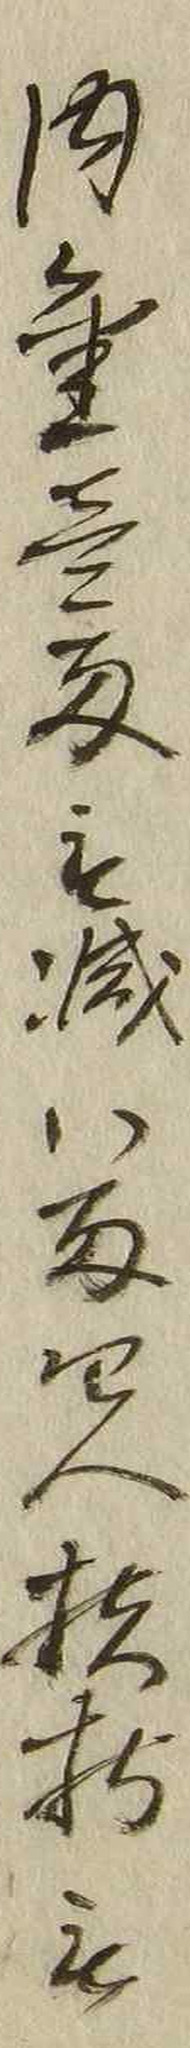内金壱両被減八両四人扶持被
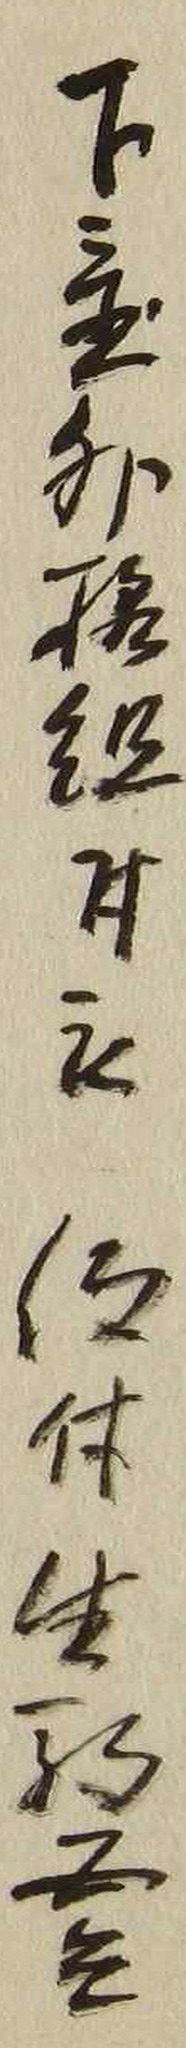下置外様組付被仰付生駒五兵
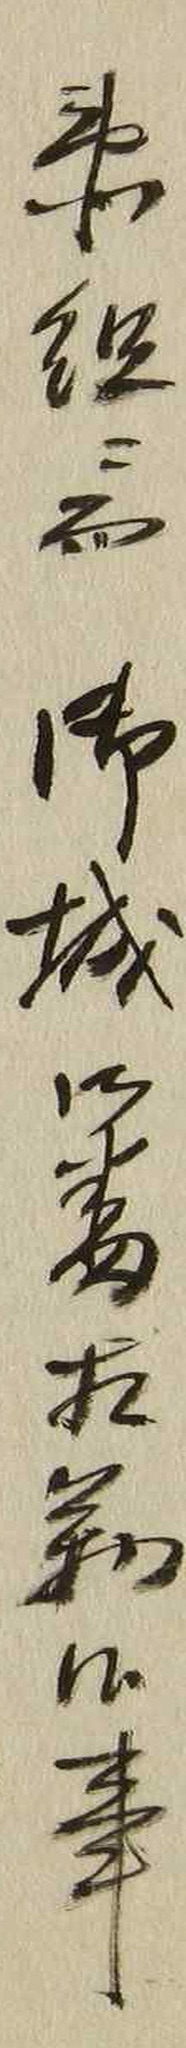衛組ニ而御城御番相勤候事
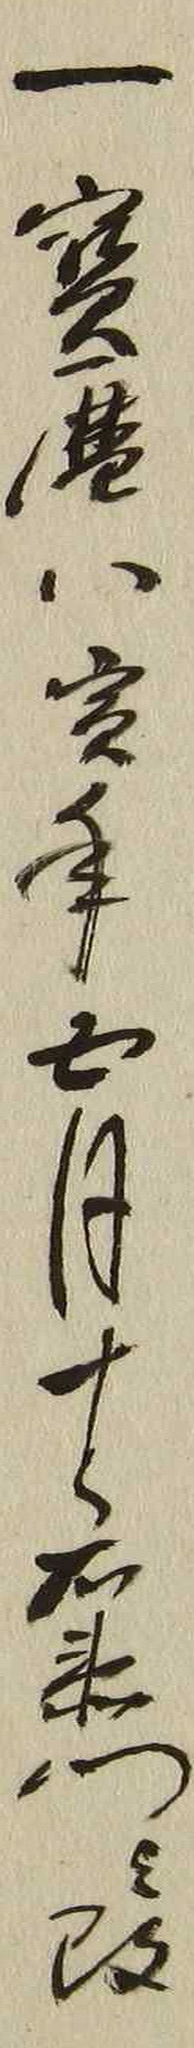一宝暦八寅年五月十郎右衛門与改
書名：諸士系譜　巻之359　す之部9
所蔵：会津若松市立会津図書館
